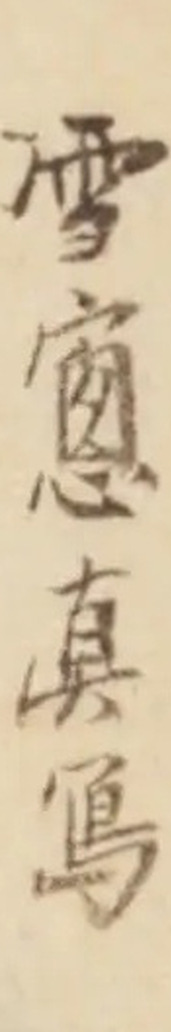雪窓真写
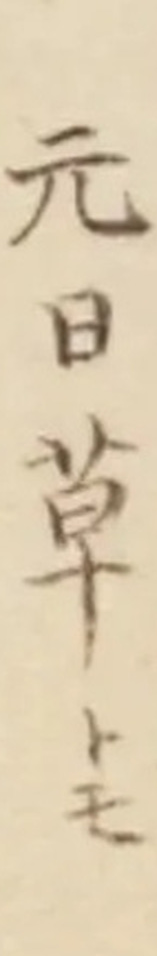元日草トモ
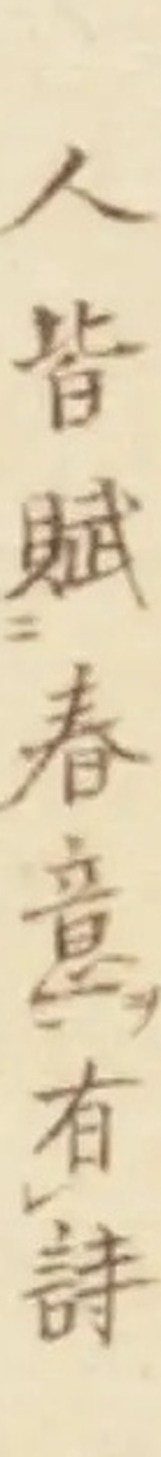人皆賦春意有詩
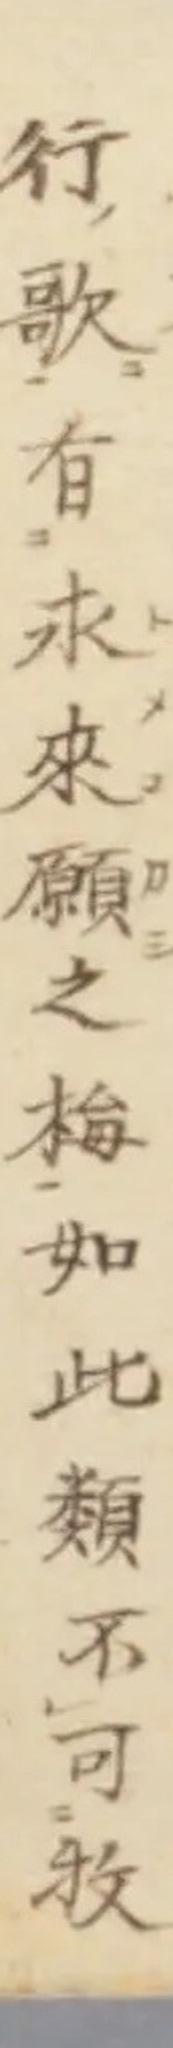行歌有求来願之梅如比類不可枚
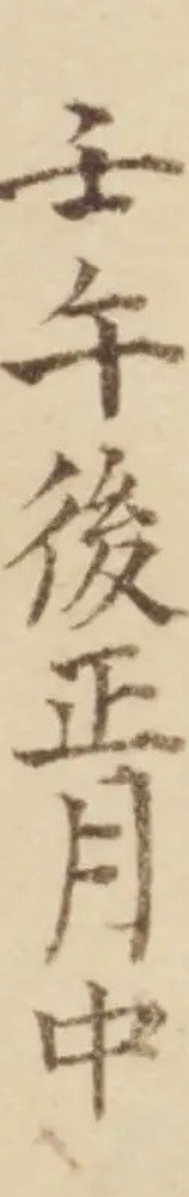壬午後正月中

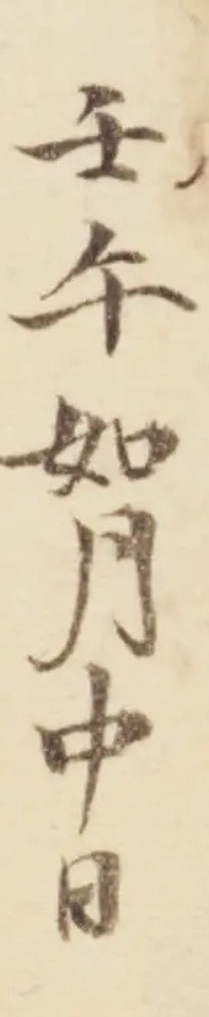壬午如月中日
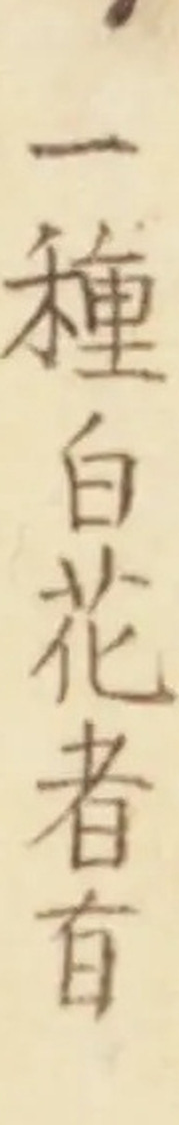一種白花者有
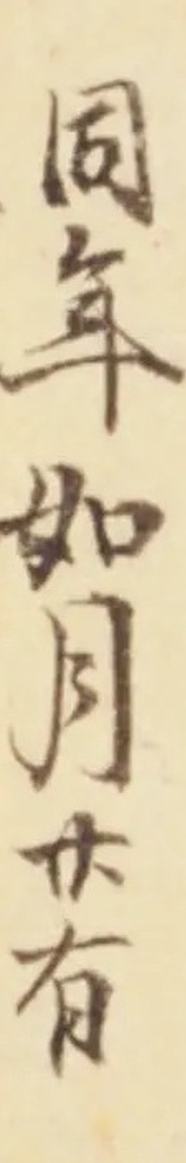同年如月廿有
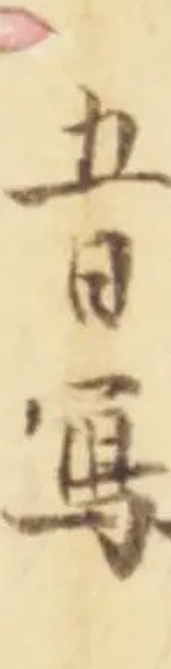五日写
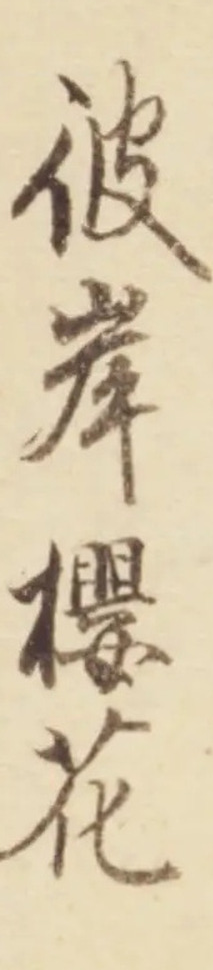彼岸桜花
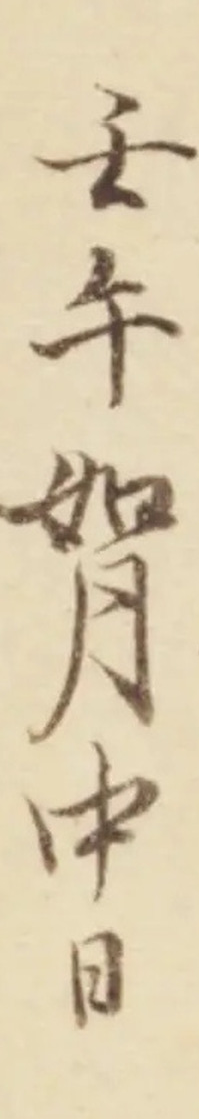壬午如月中日
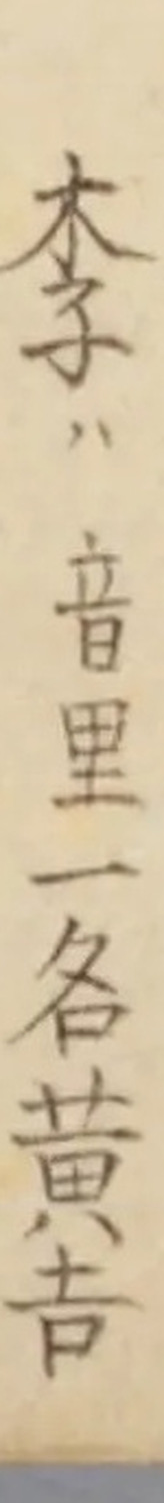李音里一名黄吉
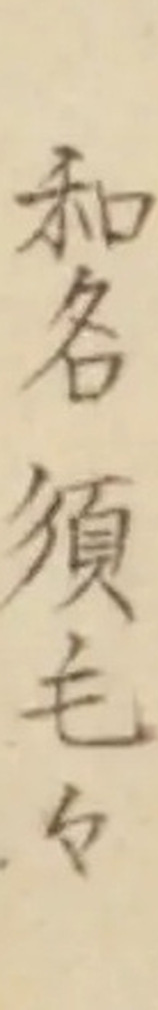和名須毛々

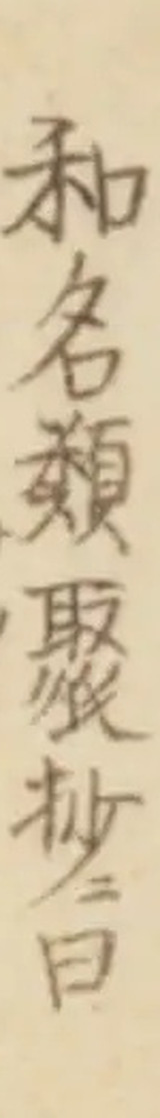和名類聚抄ニ曰
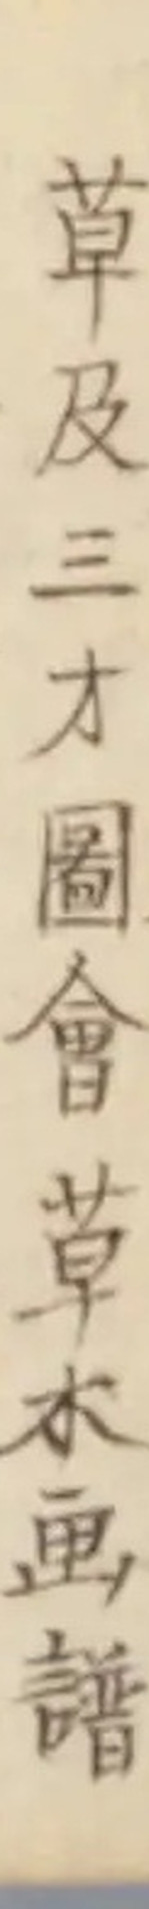草及三才図会草木画譜
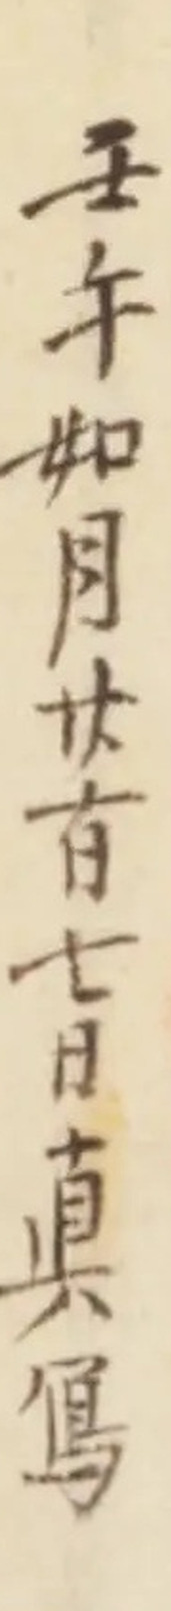壬午如月廿有七日真写
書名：梅園草木花譜春之部. 1
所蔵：国立国会図書館 National Diet Library, JAPAN
